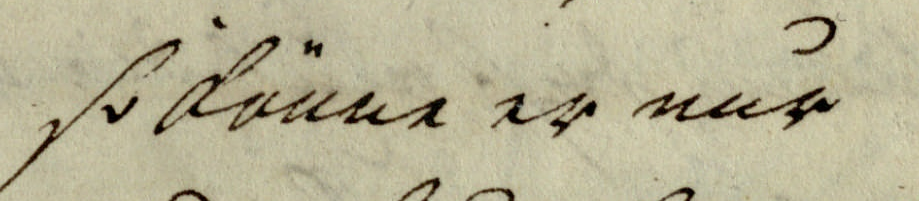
so könne er nur
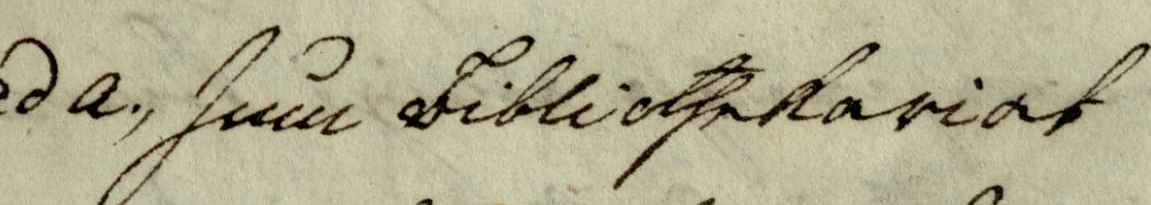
ad a., zum Bibliothekariat
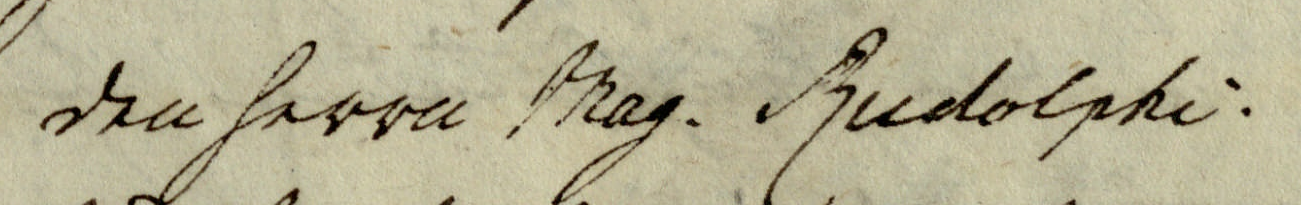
den Herrn Mag. Rudolphi.
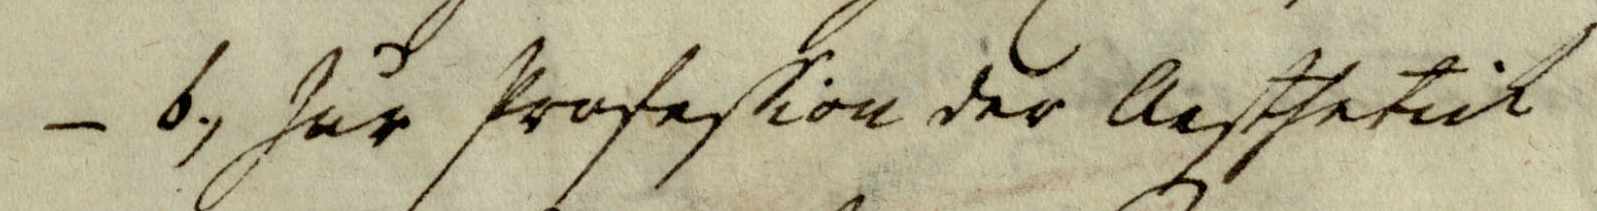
— b., zur Profession der Aesthetick
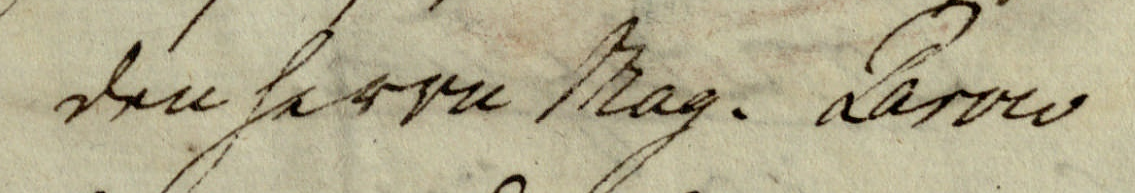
den Herrn Mag. Larow
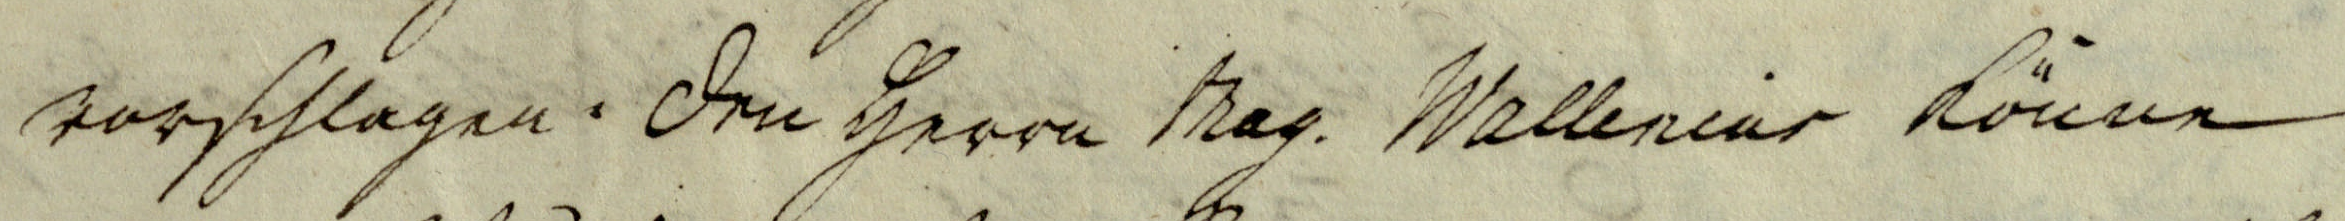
vorschlagen. Den Herrn Mag. Wallenius könne
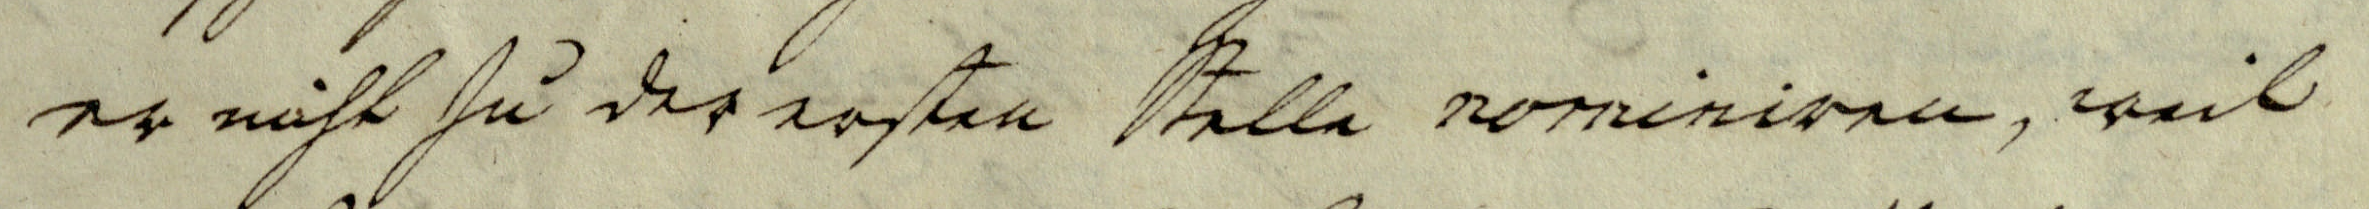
er nicht zu der ersten Stelle nominiren, weil
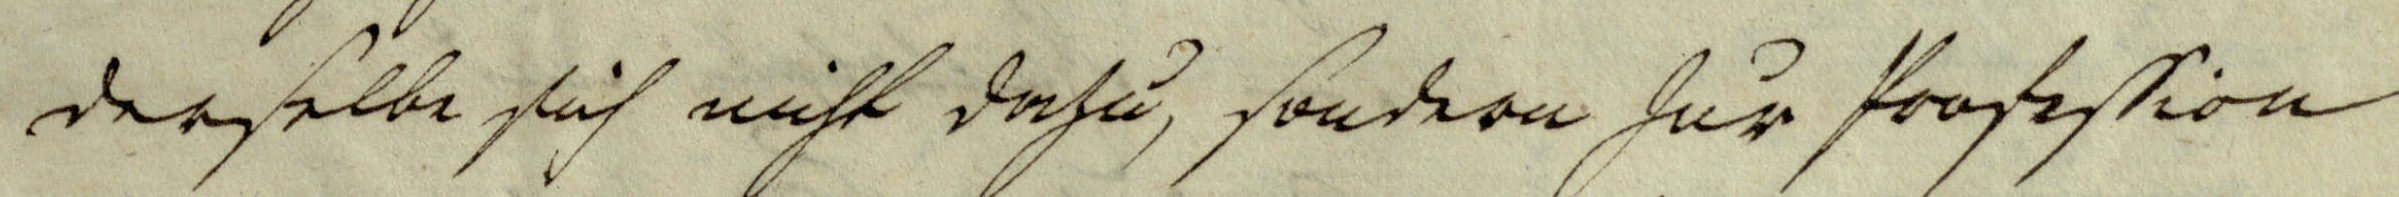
derselbe sich nicht dazu, sondern zur Profession
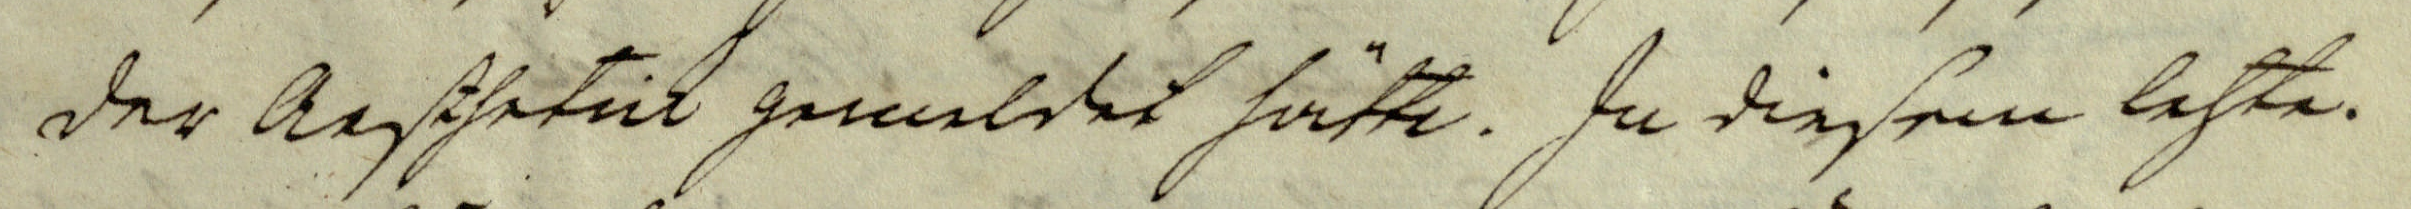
der Aesthetick gemeldet hätte. In diesem letzte¬
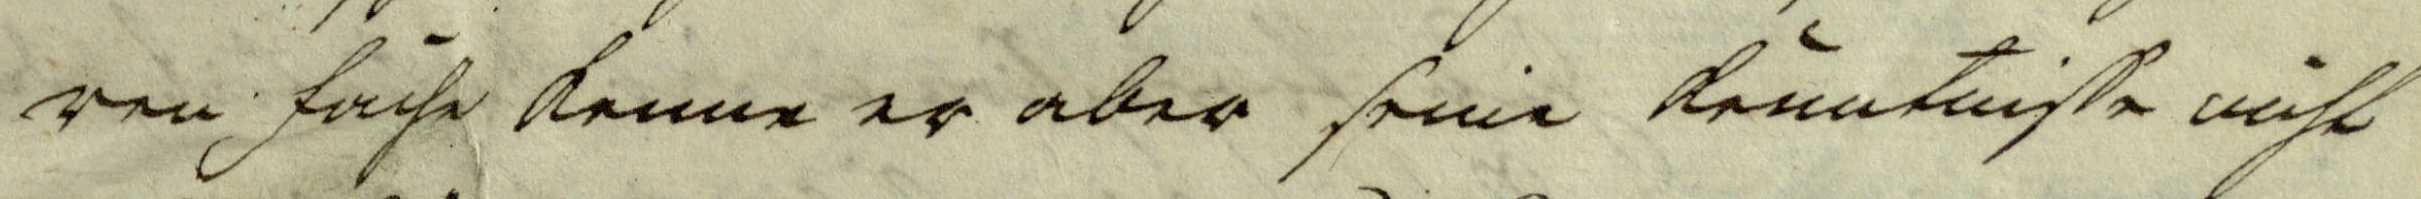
ren Fache kenne er aber seine Kenntnisse nicht
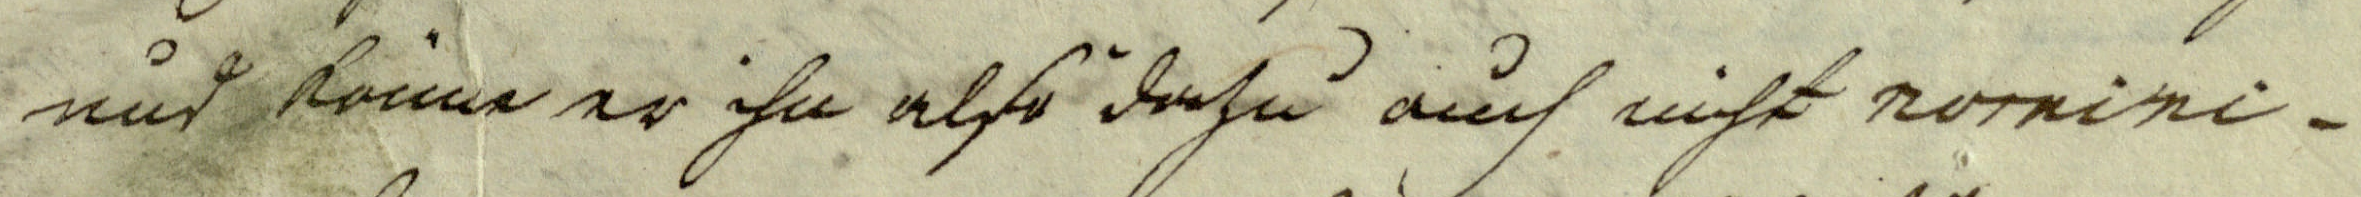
und könne er ihn also dazu auch nicht nomini¬
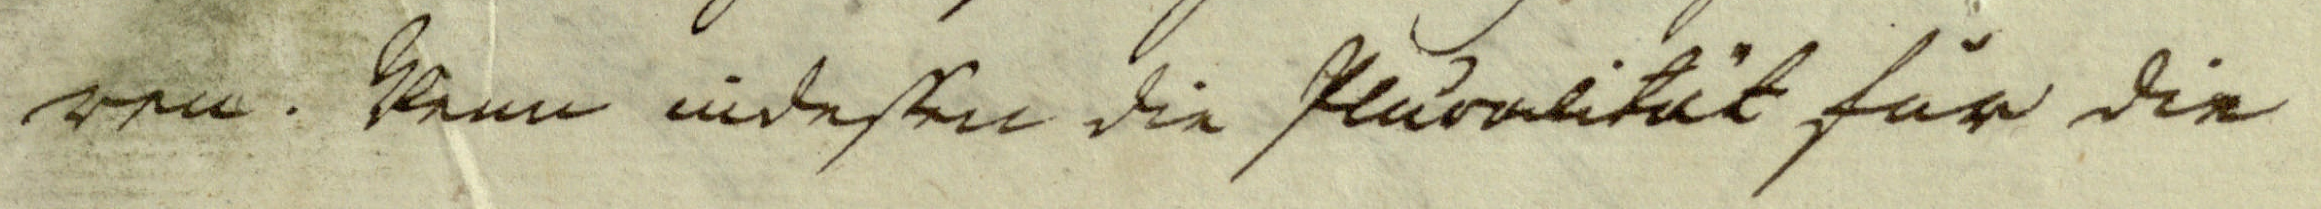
ren. Wenn indessen die Pluralität für die
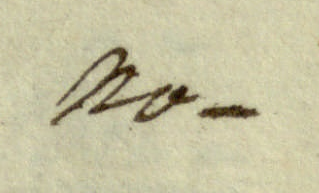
No¬
